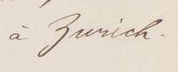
à Zurich.
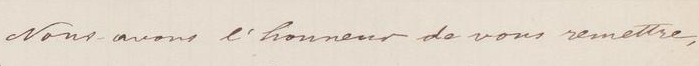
Nous avons l'honneur de vous remettre,
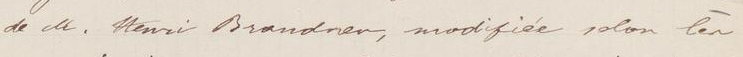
de M. Henri Brandner, modifiée selon les
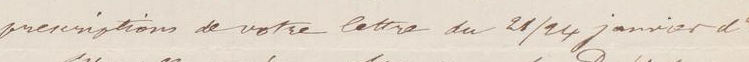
prescriptions de votre lettre du 21/24 janvier der.
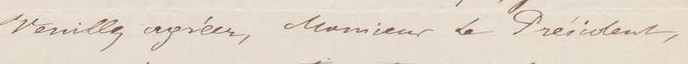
Veuillez agréer, Monsieur Le Président,
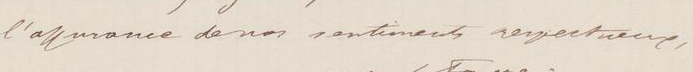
l'assurance de nos sentiments respectueux,
